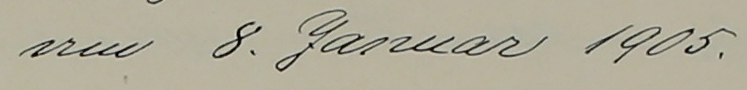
am 8. Januar 1905.
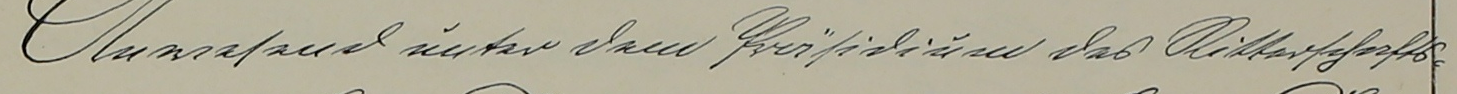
Anwesend unter dem Präsidium des Ritterschafts-
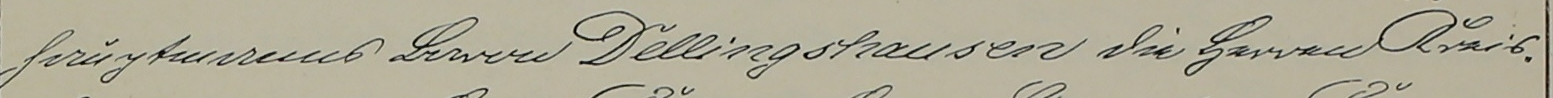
hauptmanns Baron Dellingshausen die Herren Kreis-
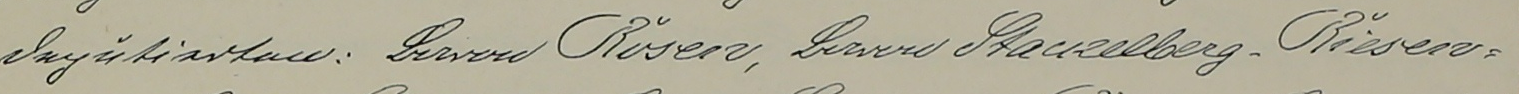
deputierten: Baron Rosen, Baron Stackelberg-Riesen-
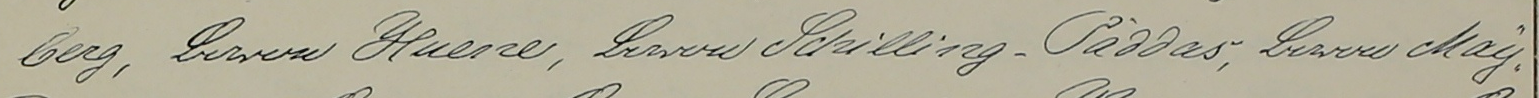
berg, Baron Huene, Baron Schilling-Paddas, Baron May-
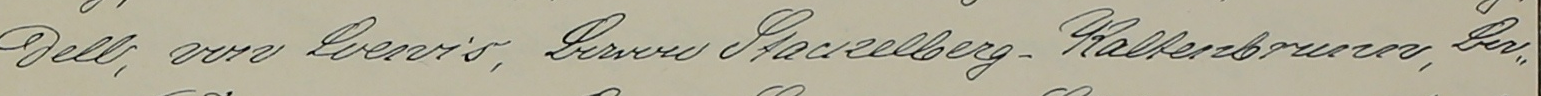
dell, von Loewis, Baron Stackelberg-Kaltenbrunn, Ba-
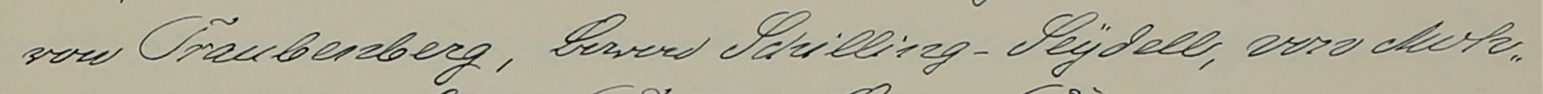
ron Traubenberg, Baron Schilling-Seydell, von Moh-
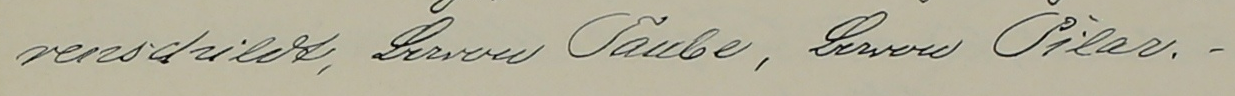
renschildt, Baron Taube, Baron Pilar.
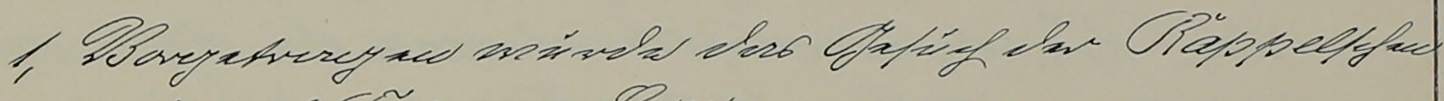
1. Vorgetragen wurde das Gesuch der Rappelschen
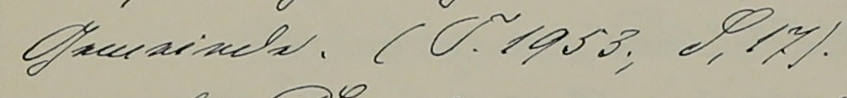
Gemeinde. (T.1953; S.17).
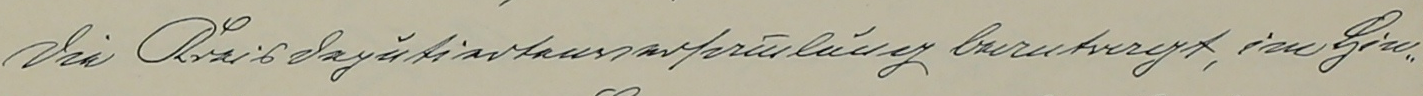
Die Kreisdeputiertenversammlung beantragt, im Hin-
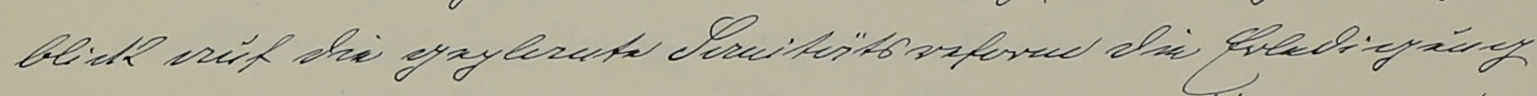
blick auf die geplante Sanitätsreform die Erledigung
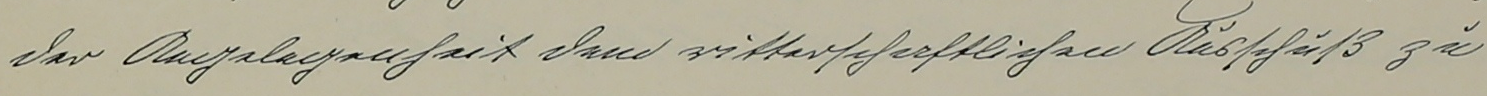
der Angelegenheit dem ritterschaftlichen Ausschuß zu
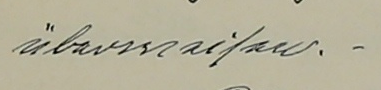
überweisen.
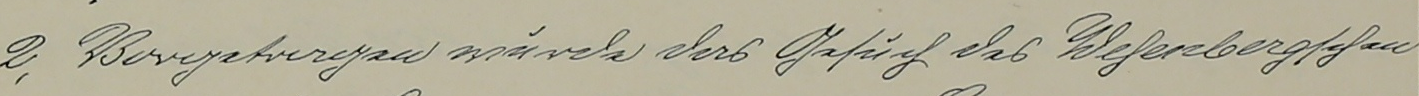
2. Vorgetragen wurde das Gesuch des Wesenbergschen
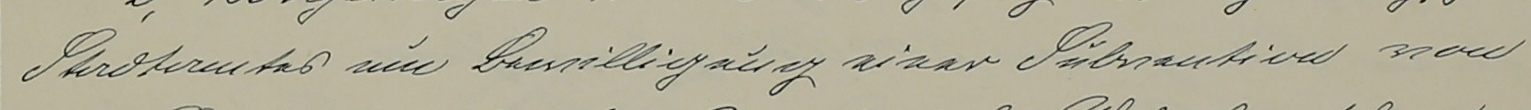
Stadtamtes um Bewilligung einer Subvention von
